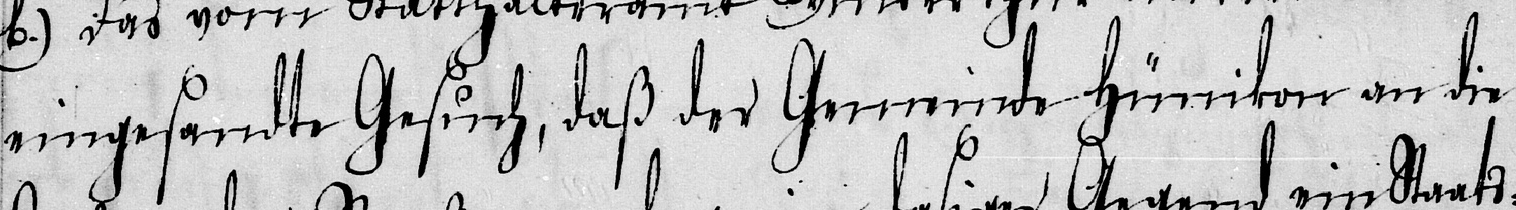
eingesandte Gesuch, daß der Gemeinde Hünikon an die
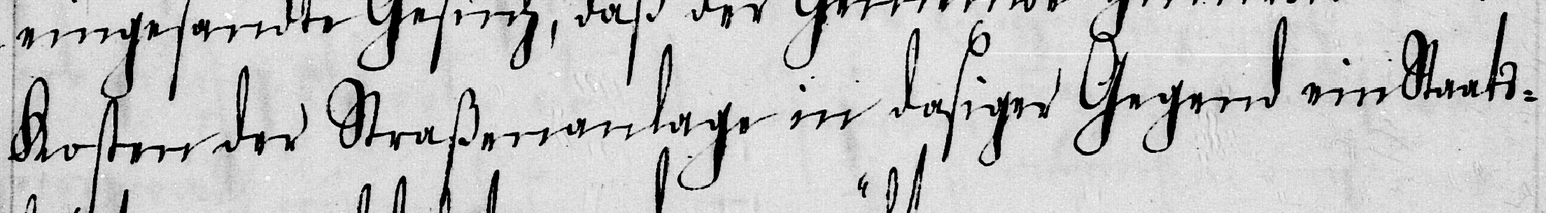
Kosten der Straßenanlage in dasiger Gegend ein Staats¬
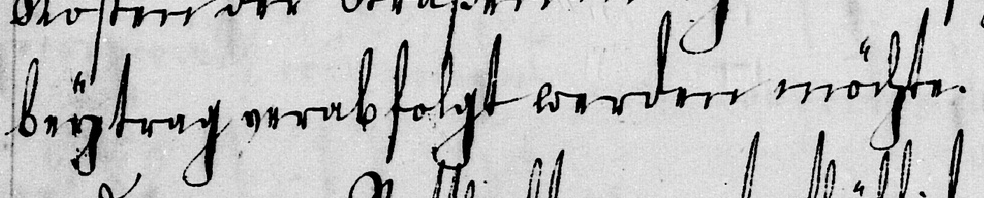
beytrag verabfolgt werden möchte.
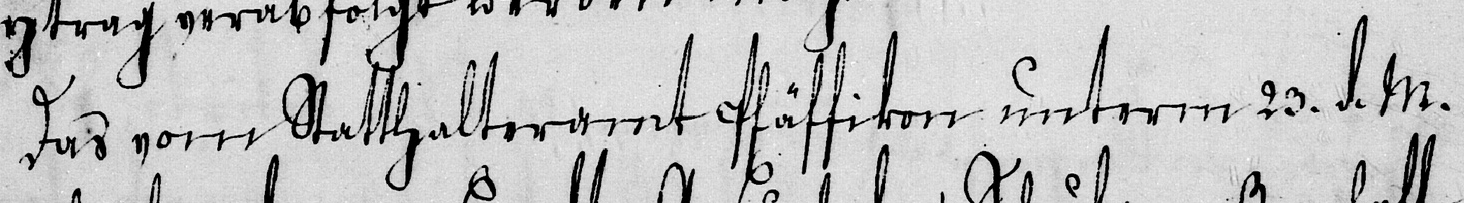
Das vom Statthalteramt Pfäffikon unterm 23. d. M.
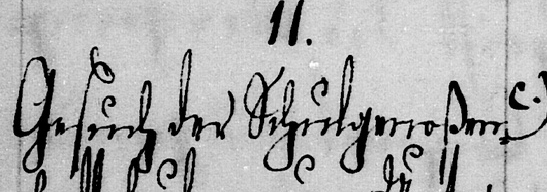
Gesuch der Schulgenoßen¬
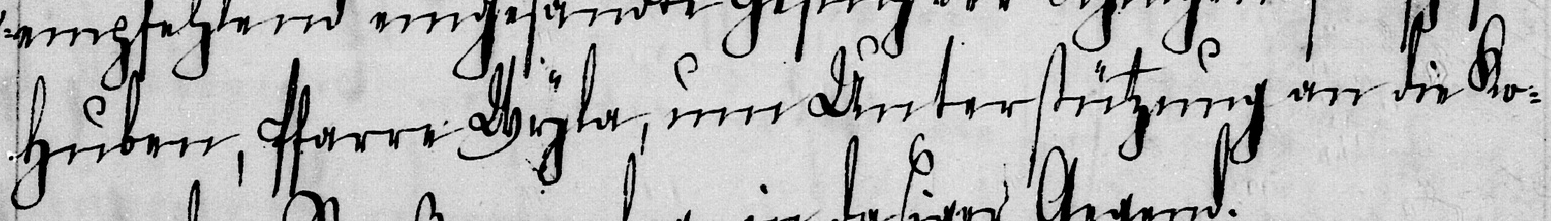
Huben, Pfarre Wyla, um Unterstützung an die Ko¬
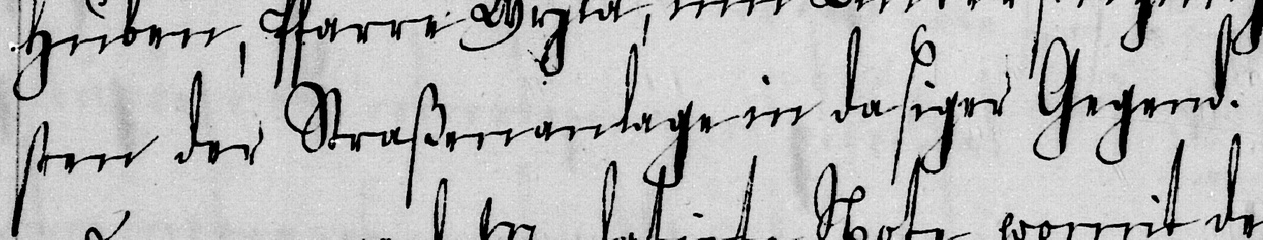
sten der Straßenanlage in dasiger Gegend.
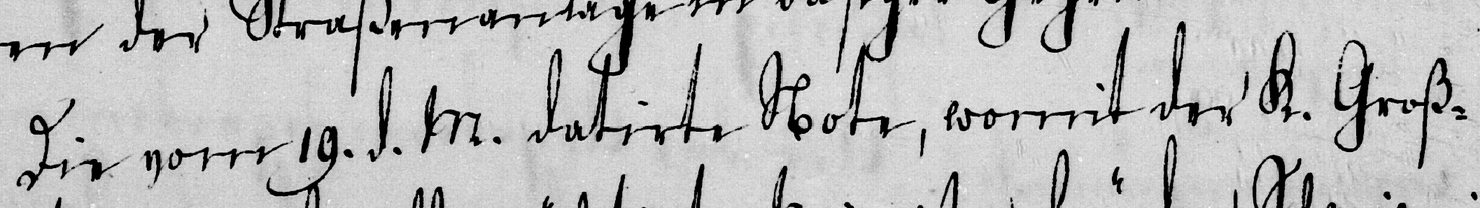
Die vom 19. d. M. datirte Note, womit der K. Groß¬
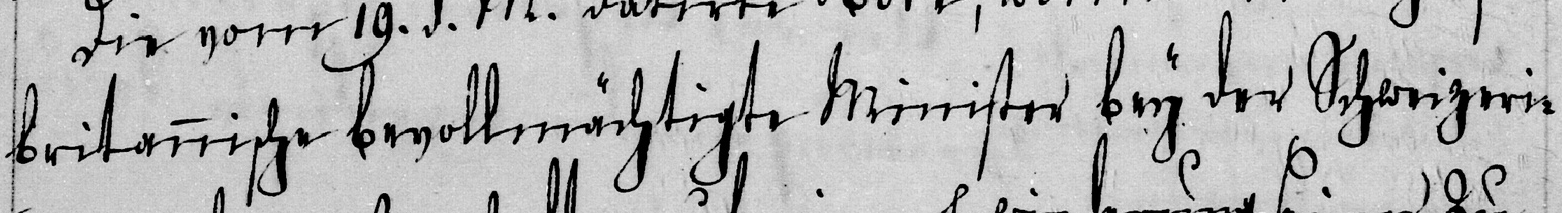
britannische bevollmächtigte Minister bey der Schweizeri¬
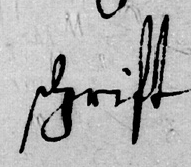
schaft
